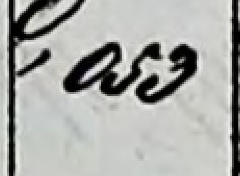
0,053
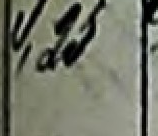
3,25
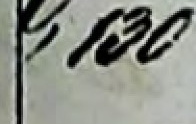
0,130
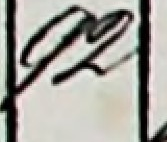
92
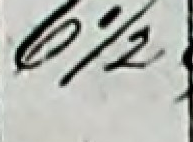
6 ½
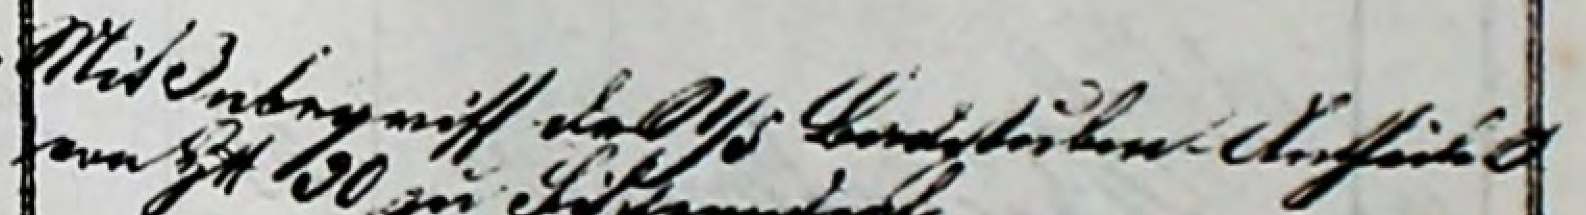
Mit Inbegriff des 95 Badstuben Antheiles
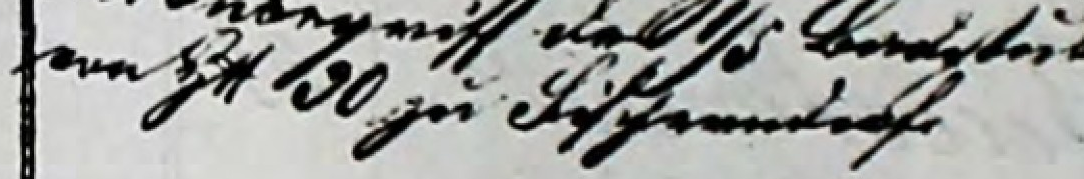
von H? 30 zu Fischerndorf
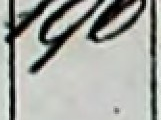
196
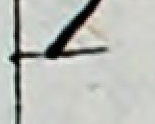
I
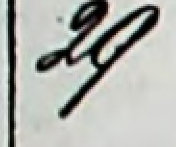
29
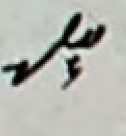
do
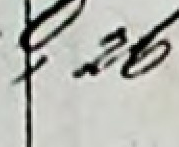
0,26
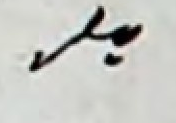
do
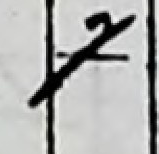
7
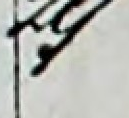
29
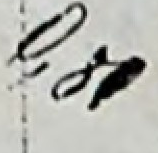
0,81
